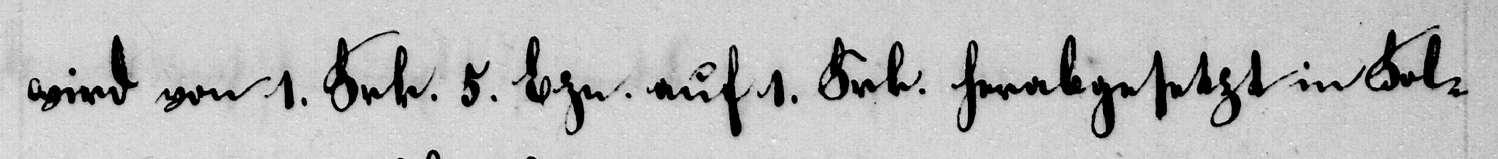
wird von 1. Frk. 5. Bzn. auf 1. Frk. herabgesetzt in Fol¬
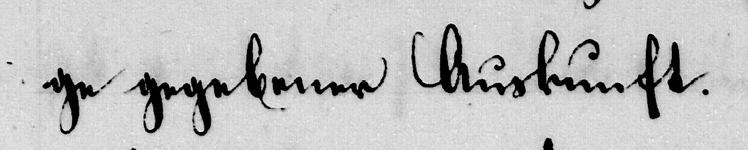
ge gegebener Auskunft.
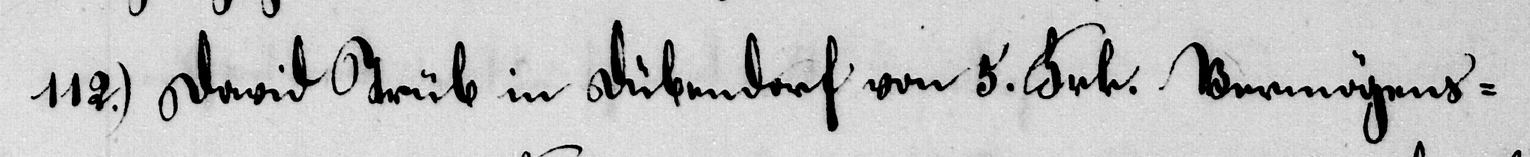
112.) David Trüb in Dübendorf von 5. Frk. Vermögens¬
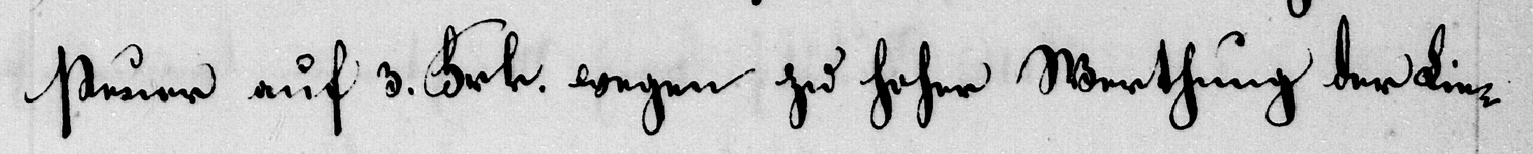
steuer auf 3. Frk. wegen zu hoher Werthung der Lie¬
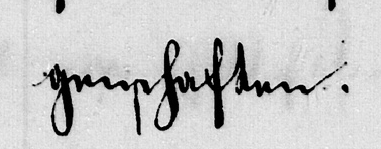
genschaften.
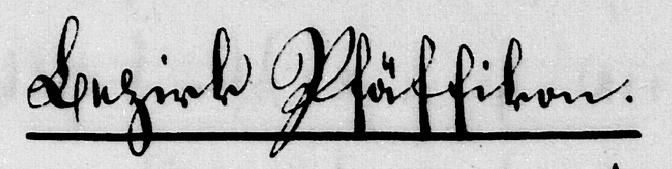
Bezirk Pfäffikon.
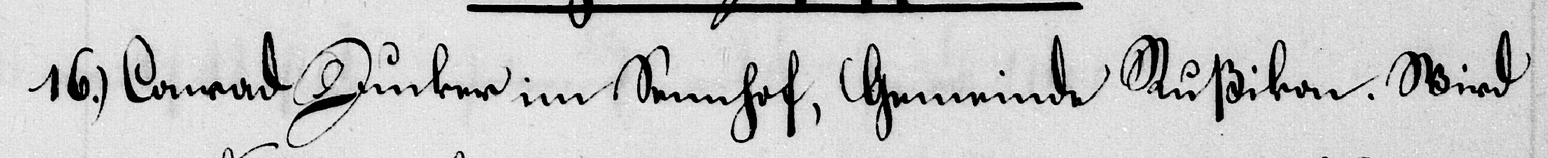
16.) Conrad Junker im Sennhof, Gemeinde Rußikon. Wird
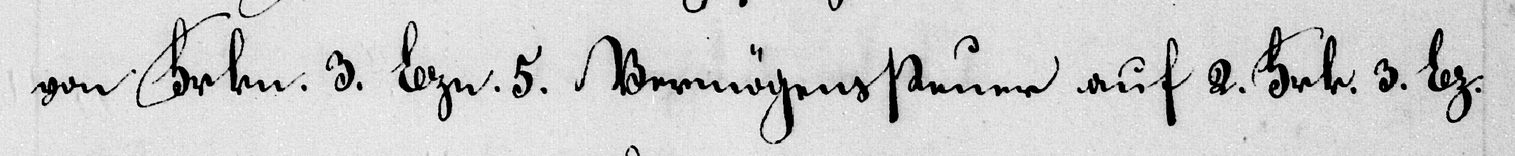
von Frkn. 3. Bzn. 5. Vermögenssteuer auf 2. Frk. 3. Bz.
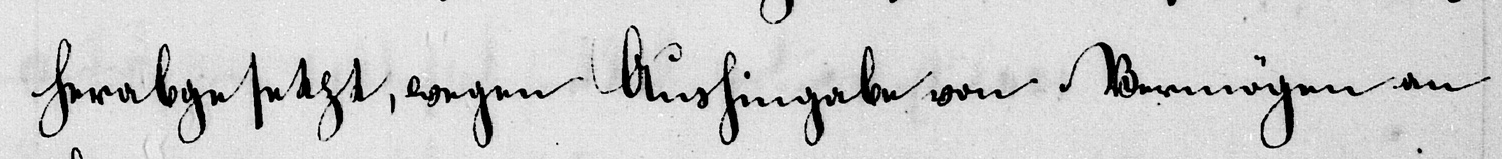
herabgesetzt, wegen Aushingabe von Vermögen an
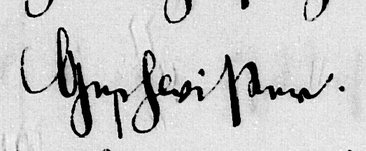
Geschwister.
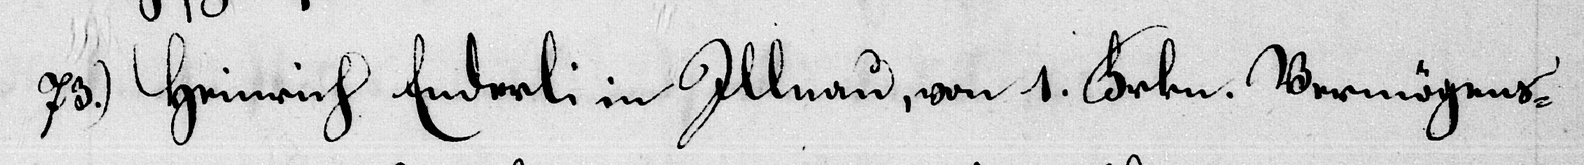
73.) Heinrich Enderli in Illnau, von 1. Frkn. Vermögens¬
